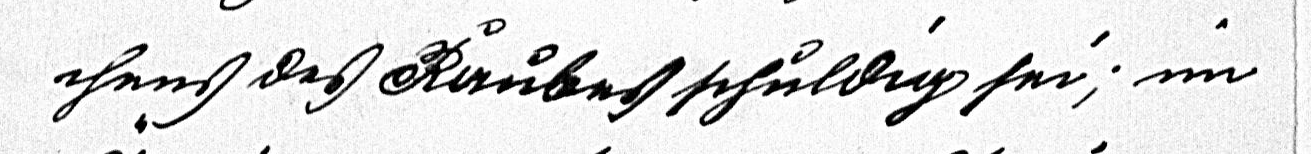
chens des Raubes schuldig sei, im
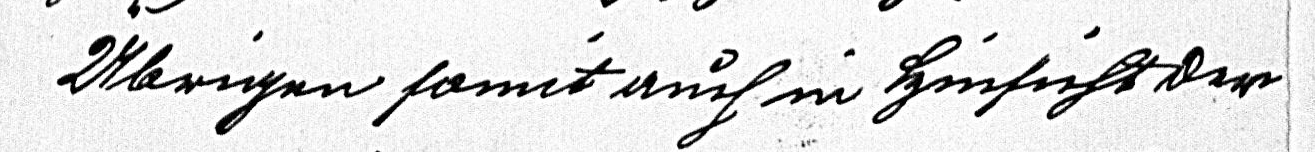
Übrigen somit auch in Hinsicht der
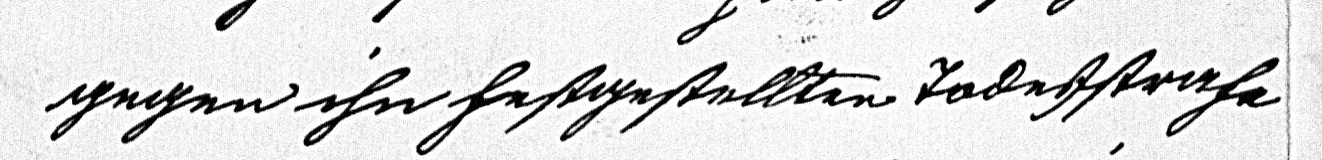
gegen ihn festgestellten Todesstrafe
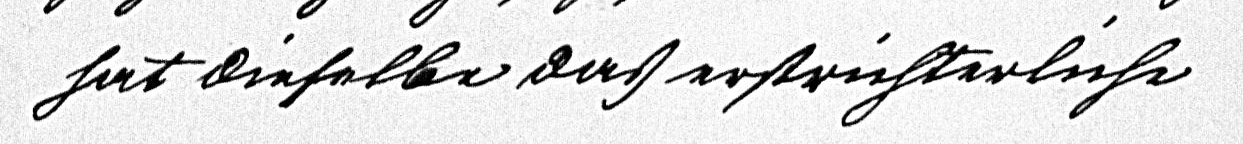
hat dieselbe das erstrichterliche
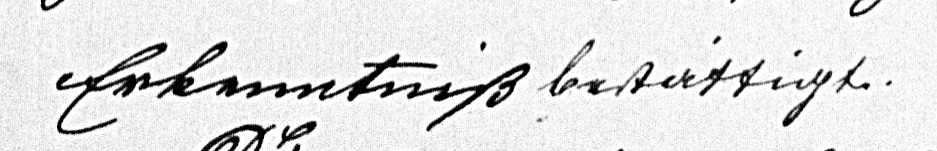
Erkenntniß bestättigt.
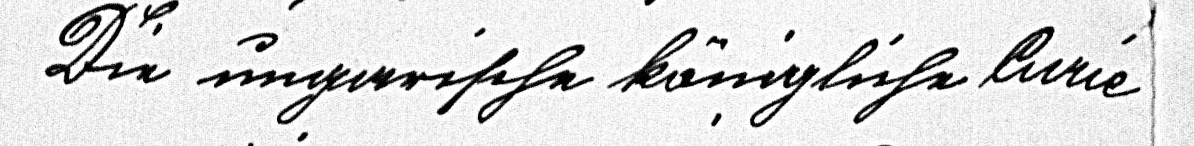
Die ungarische königliche Curie
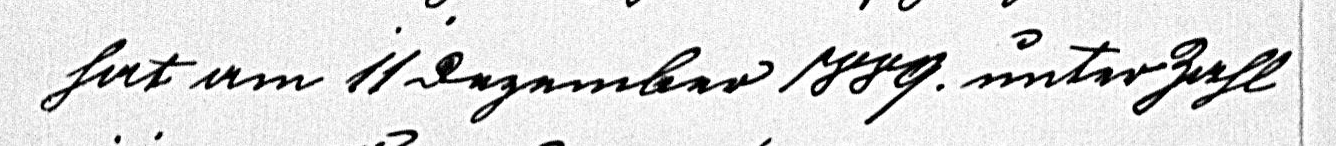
hat am 11 Dezember 1889. unter Zahl
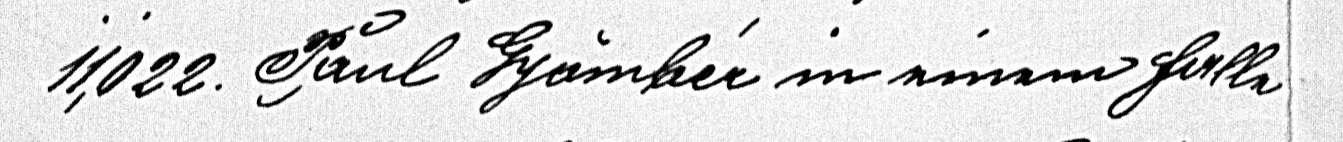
11,022. Paul Gyömbér in einem Halle
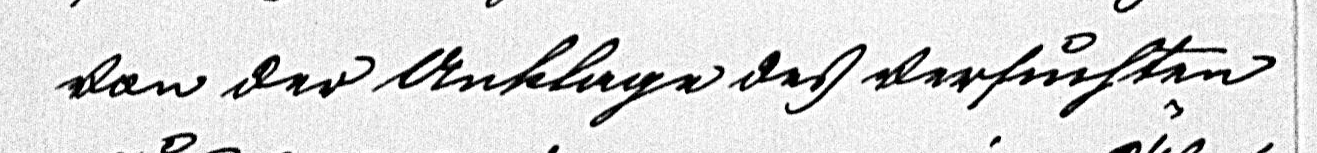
von der Anklage des versuchten
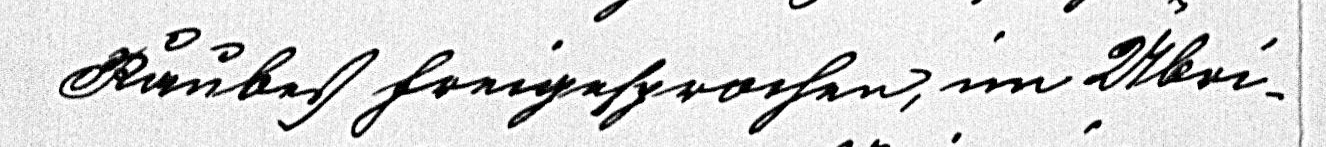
Raubes freigesprochen, im Übri¬
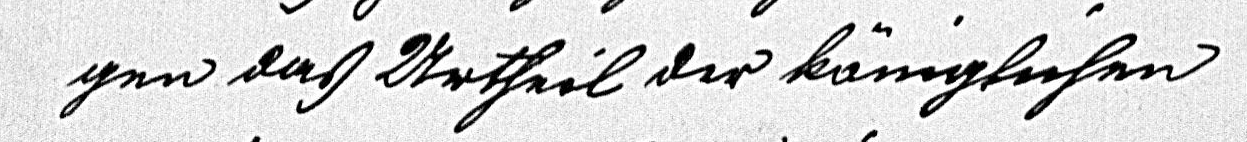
gen das Urtheil der königlichen
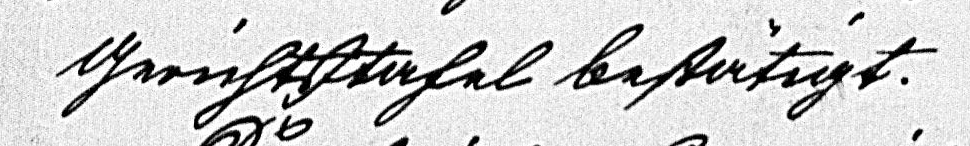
Gerichttafel bestätigt.
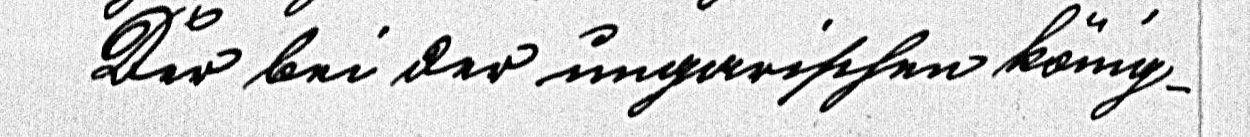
Der bei der ungarischen könig
